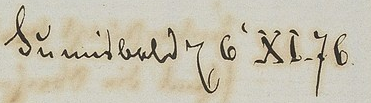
Sumiswald den 6t XI. 76.
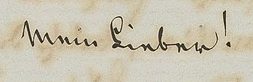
Mein Lieber!
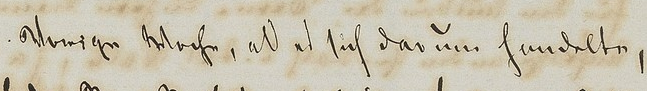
Vorige Woche, als es sich darum handelte,
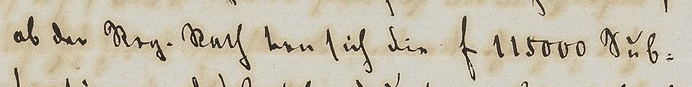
ob der Reg.Rath von sich die f 115000 Sub-
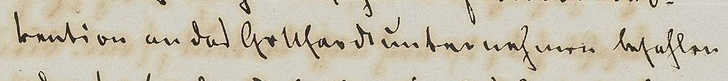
vention an das Gotthardtunternehmen bezahlen
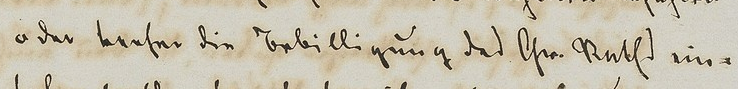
oder vorher die Bewilligung des Gr. Raths ein-
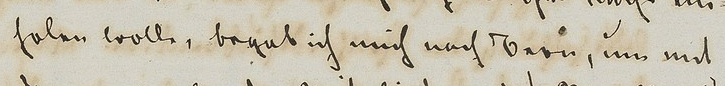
holen wolle, begab ich mich nach Bern, um mit
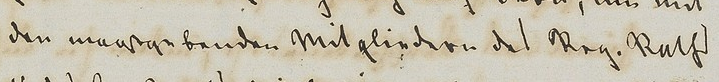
den maaßgebenden Mitgliedern des Reg.Raths
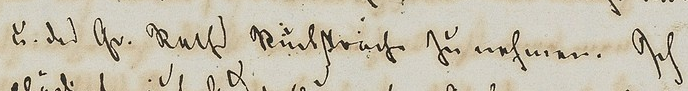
u. des Gr. Raths Rücksprache zu nehmen. Ich
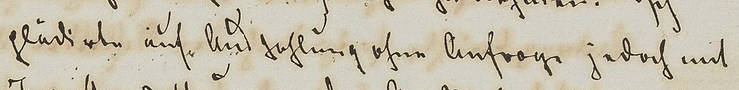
plädirte auf Auszahlung ohne Anfrage jedoch mit
